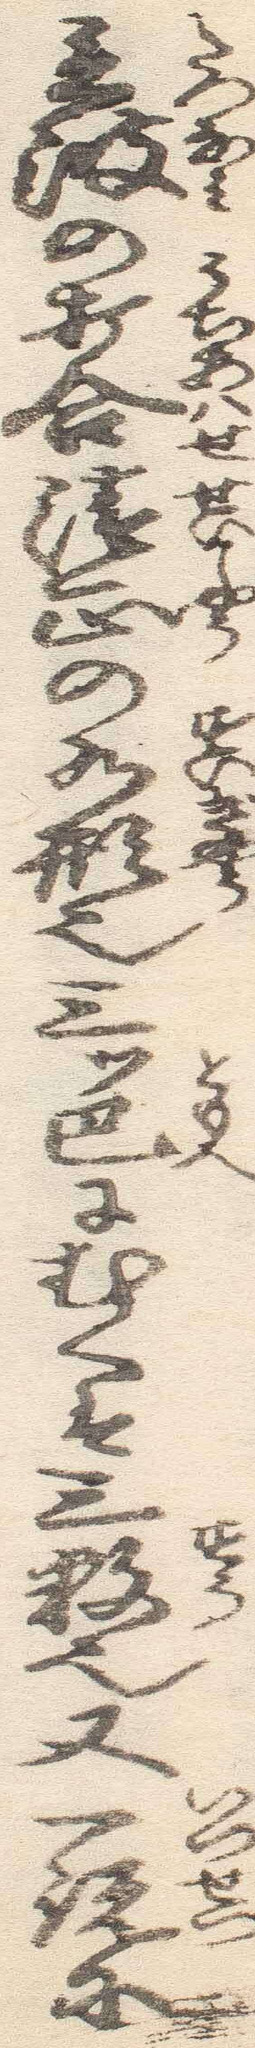立波の打合清正の水形也三つ巴にむくは三数也又一説に
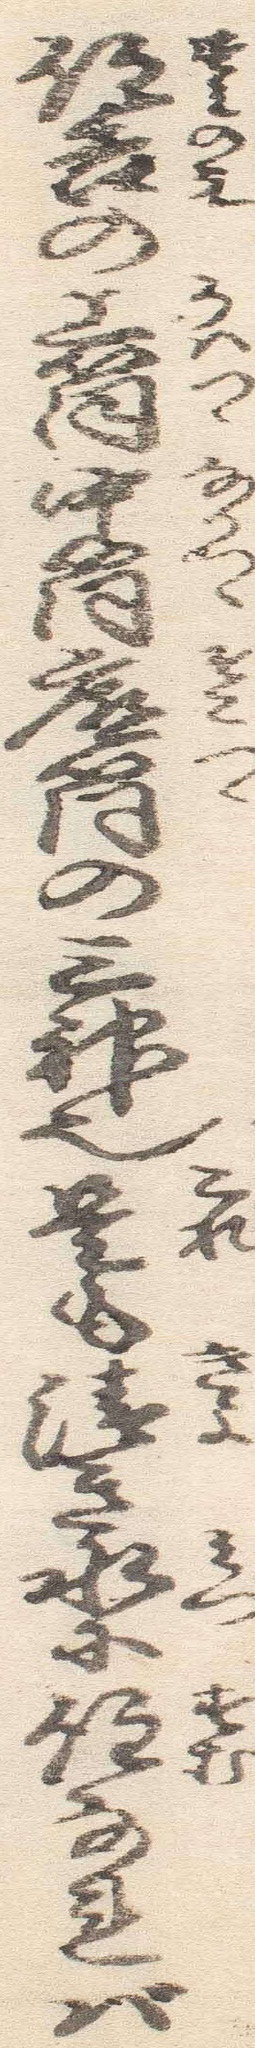住吉の上筒中筒底筒の三神也是も清き水に住なれば
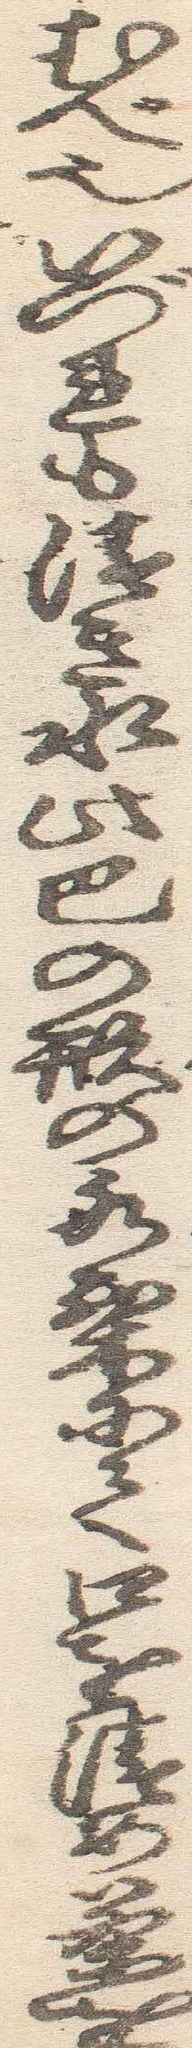むべ也いづれも清き水此巴の形の水栗にて口を清め茶を
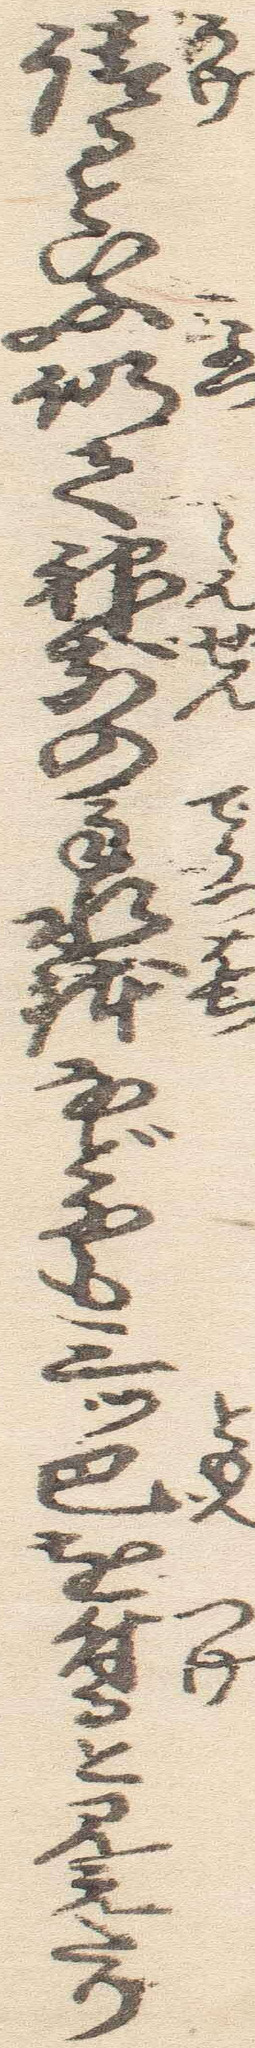請るといふ仍て神前の手水鉢などにも三つ巴を付ると見えたり
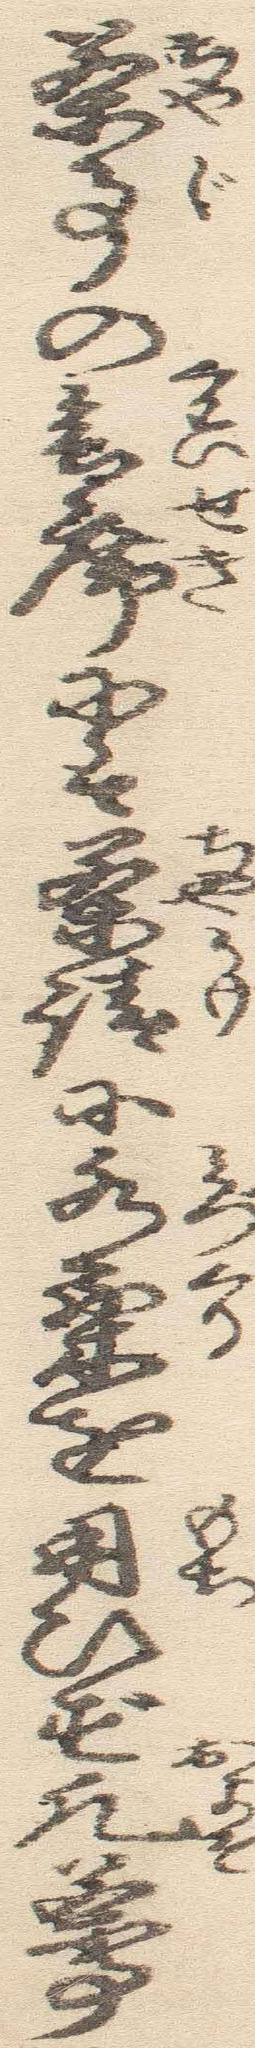茶事の会席には茶請に水栗を用ひず凡茶事
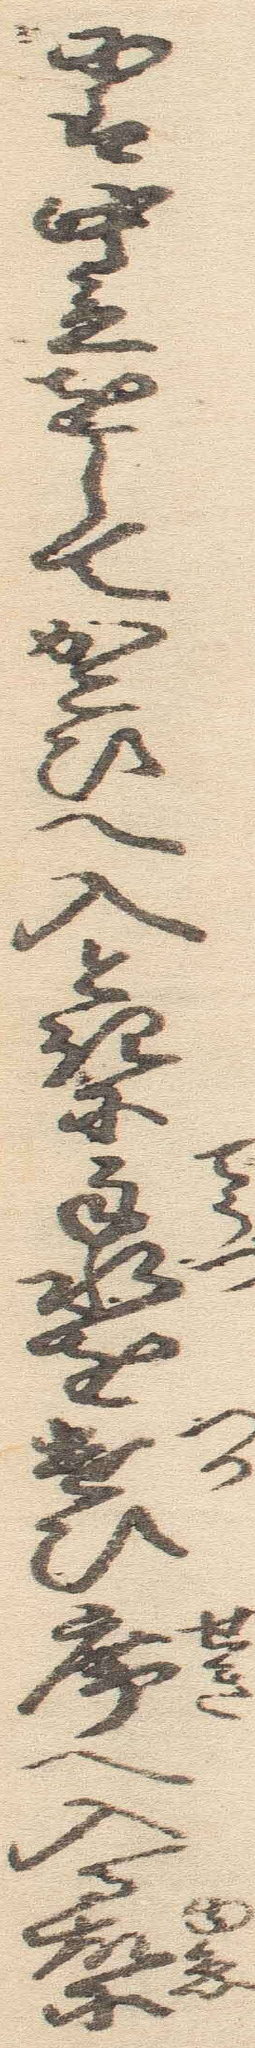には中立をしてかこひへ入ときに手水を遣ひ席へ入る故に

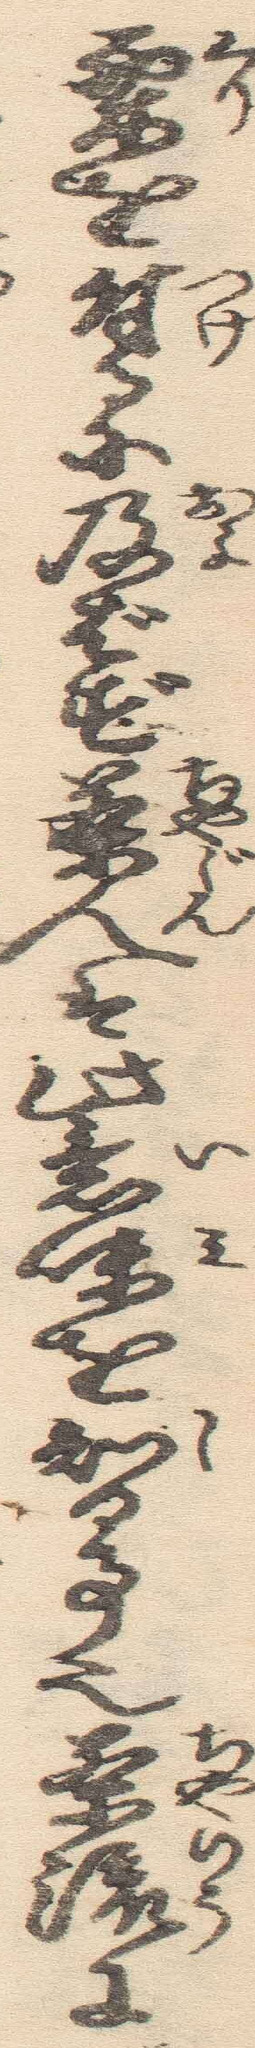栗を付るに及ばず茶人は此意味を知る事也茶流に
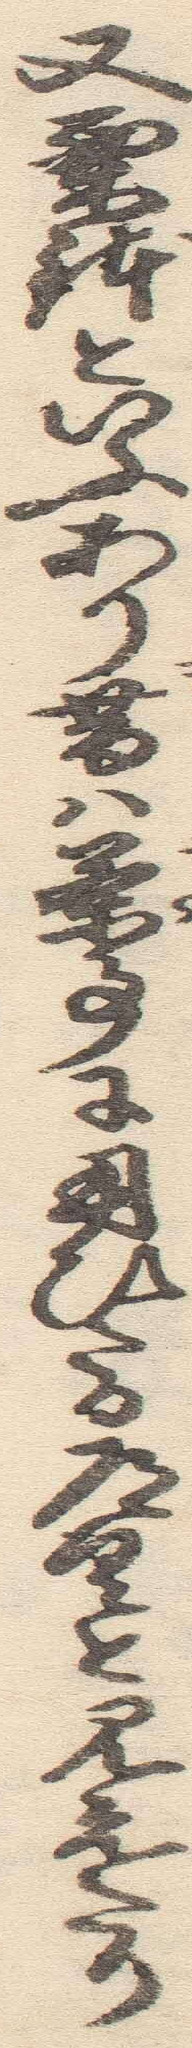又栗鉢といふあり昔は茶事に用ひたる道具と見えたり
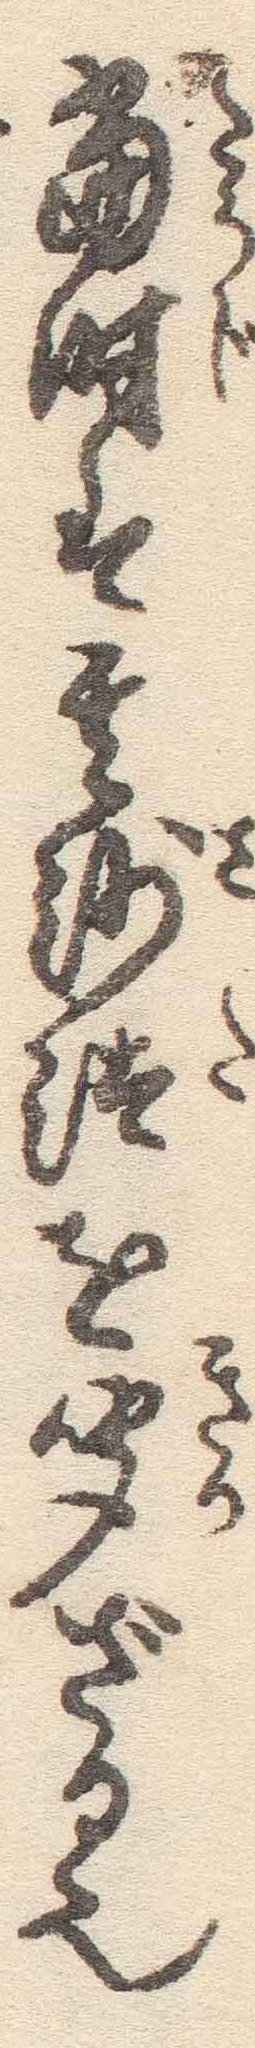当時は其沙汰を聞ざる也
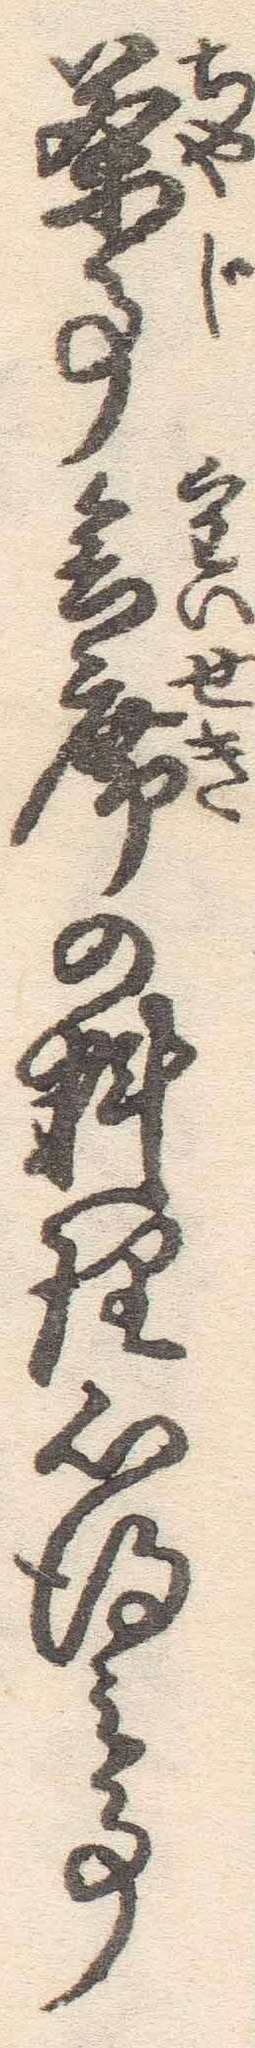茶事会席の料理心得之事
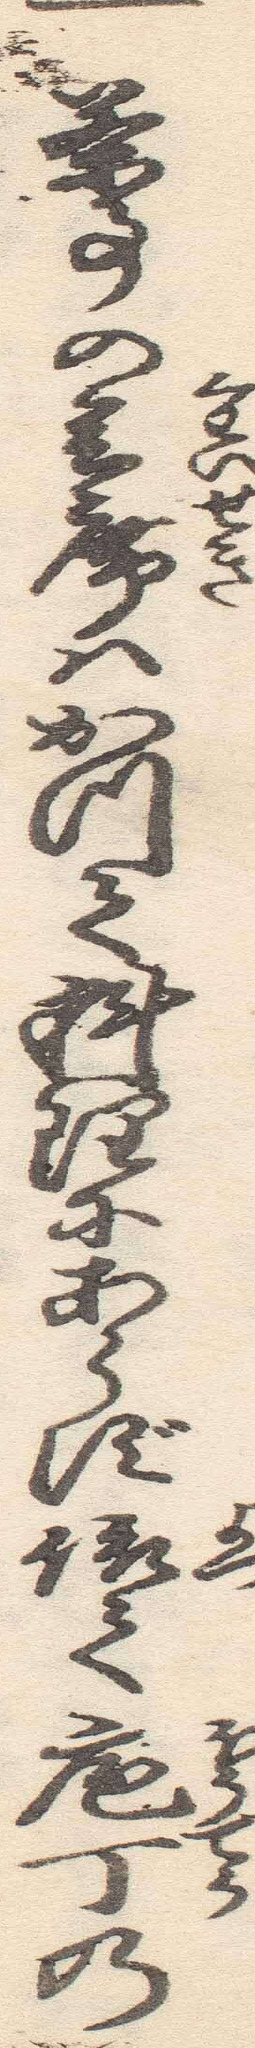一茶事の会席はかつて料理にあらず依て庖丁の
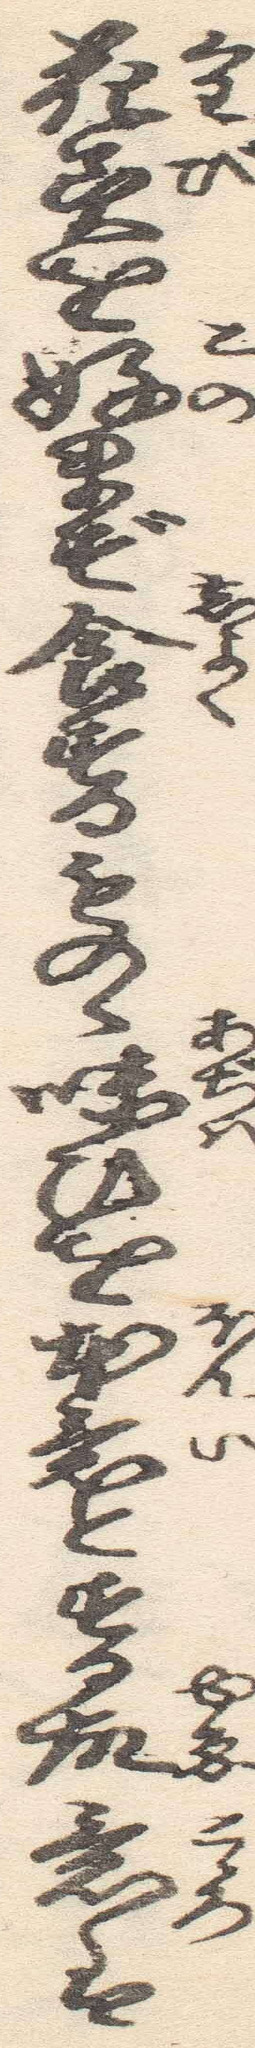花美を好まず食するものゝ味ひを本意とする故意は
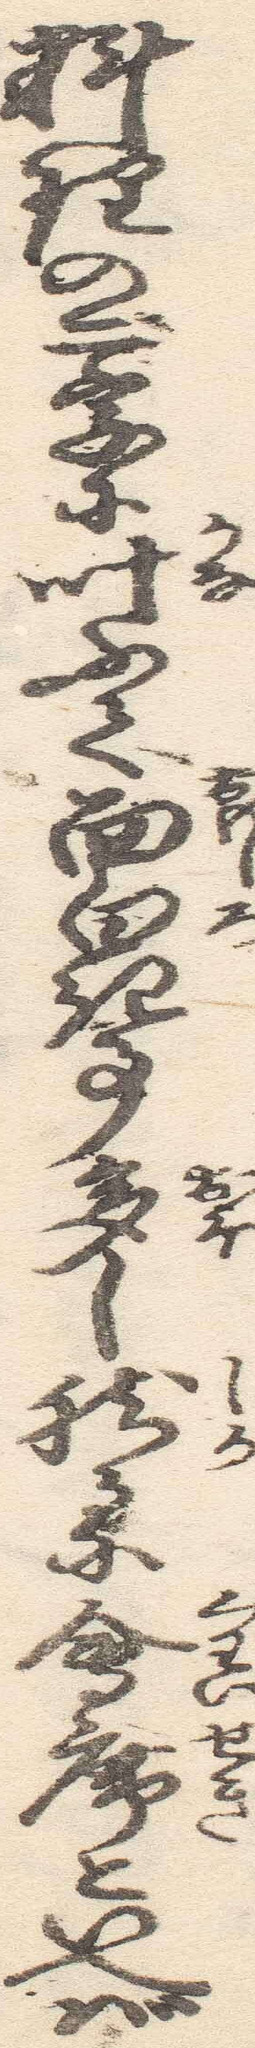料理の二字に叶ふて面白き事多し然るに会席といへば
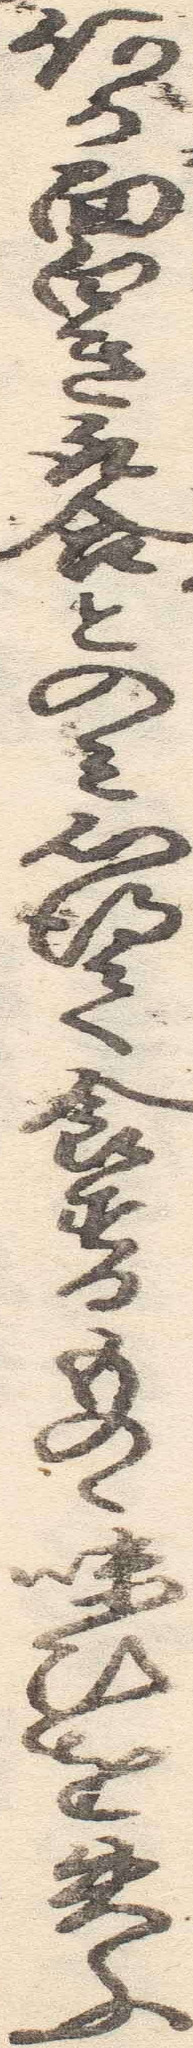何か面白き取合とのみ心得て食するものゝ味ひを失ふ
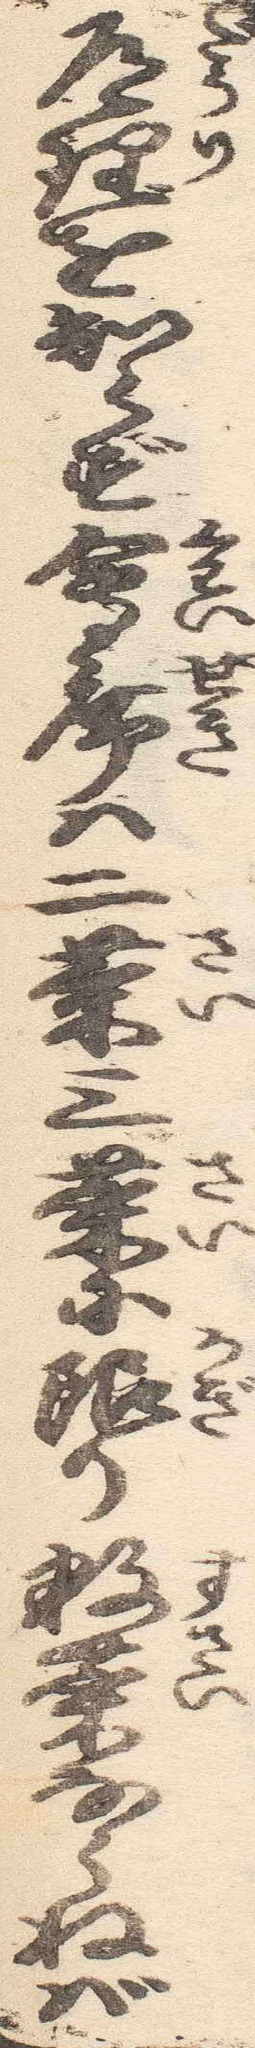道理を知らず会席は二菜三菜に限り数菜ならねば
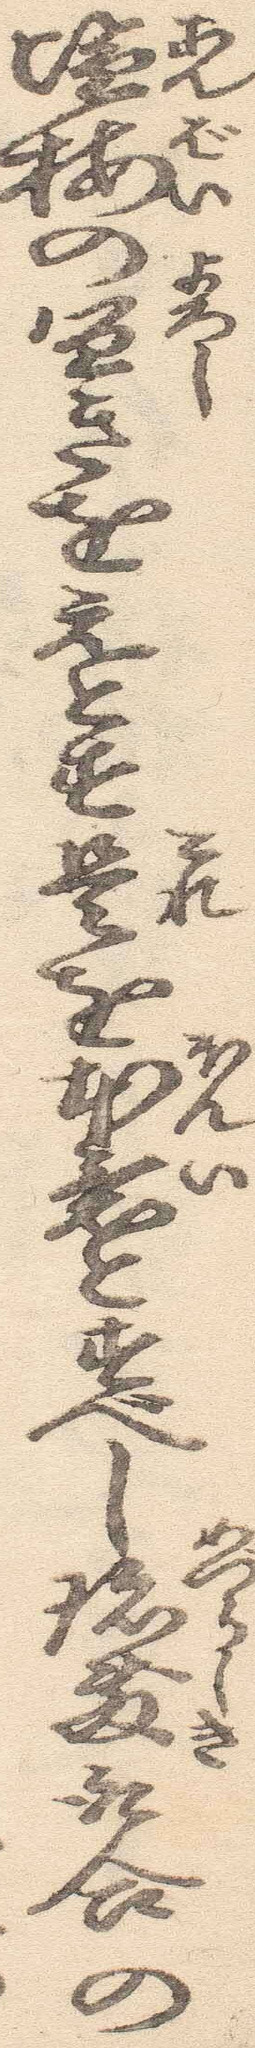塩梅の宜きをえとす是を本意とすべし珍敷取合の
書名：料理通
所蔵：東京学芸大学附属図書館 国文学研究資料館
